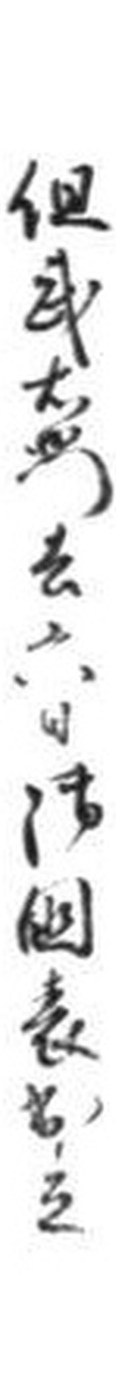但武右衛門去六日御国表出立
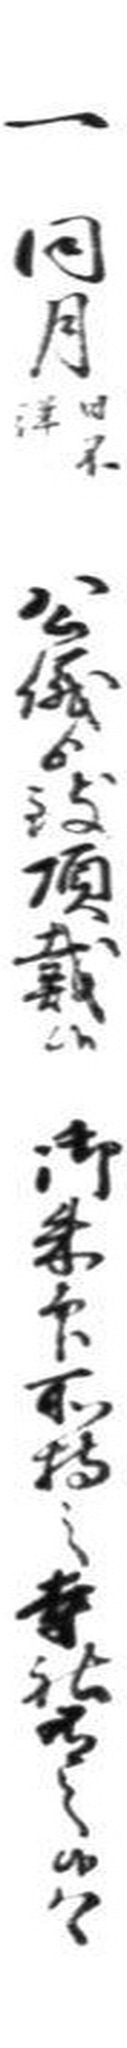一同月日不詳公儀ゟ致頂戴候御朱印所持之寺社有之候ハヽ
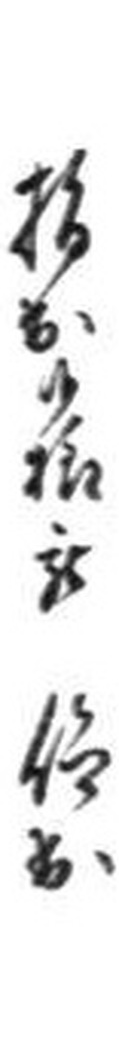指出候様被仰出
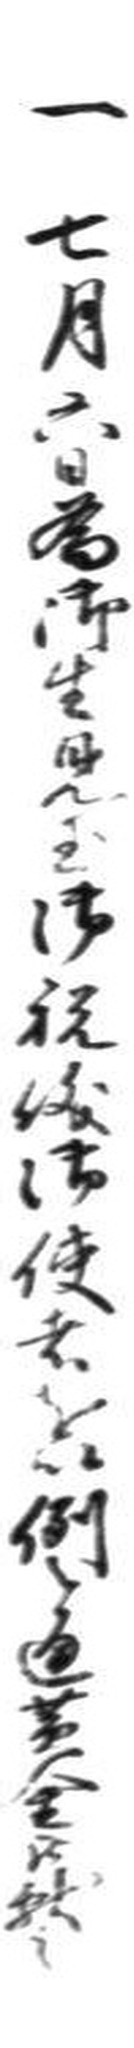一七月六日為生見玉御祝儀御使者を以例之通黄金被献之
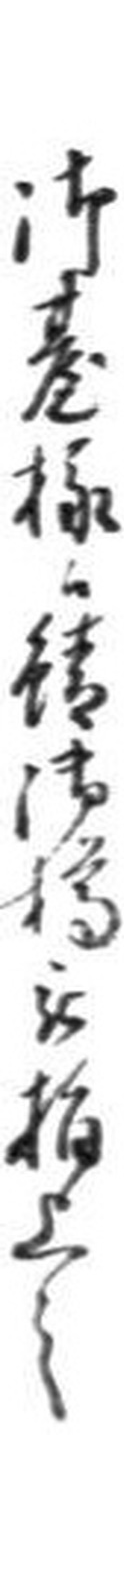御台様江鯖御樽被指上之
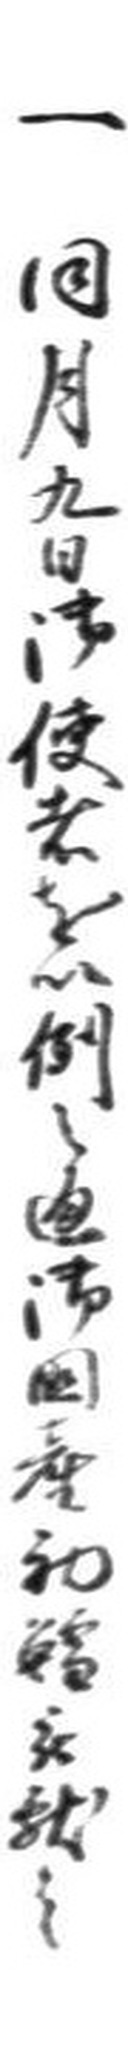一同月九日御使者を以例之通御国産初鱈被献之
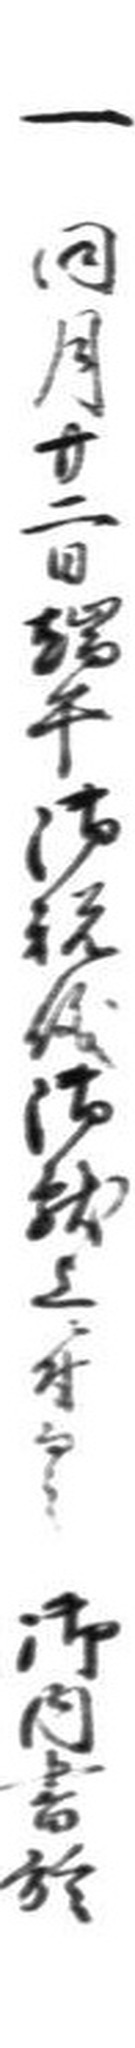一同月廿二日端午御祝儀御献上ニ付而之御内書於
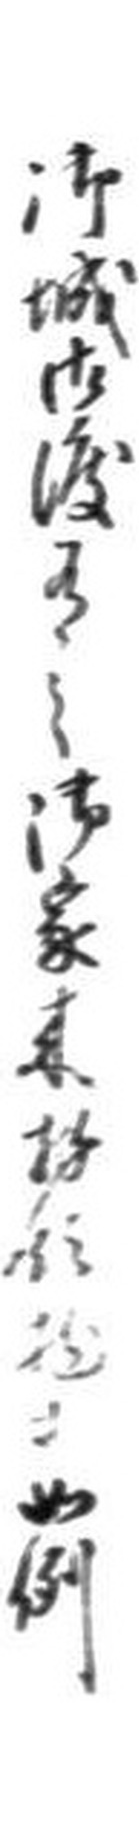御城御渡有之御家来拝領物等如例
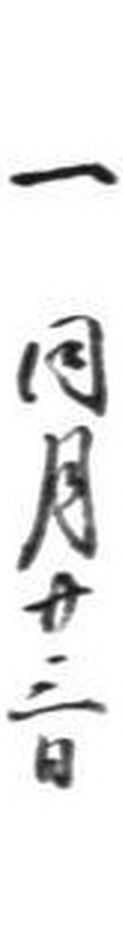一同月廿三日
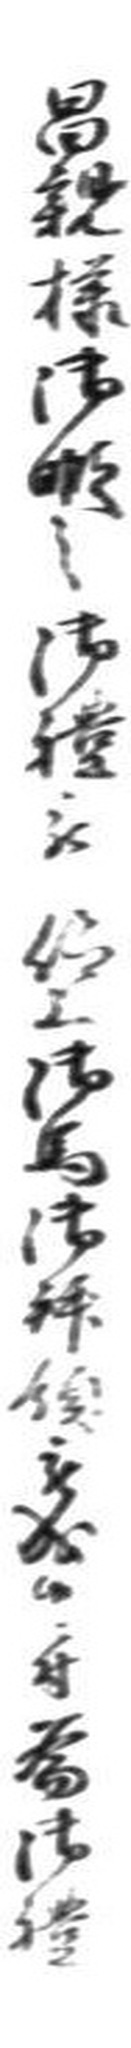昌親様御暇之御礼被仰上御馬御拝領被成候ニ付為御礼
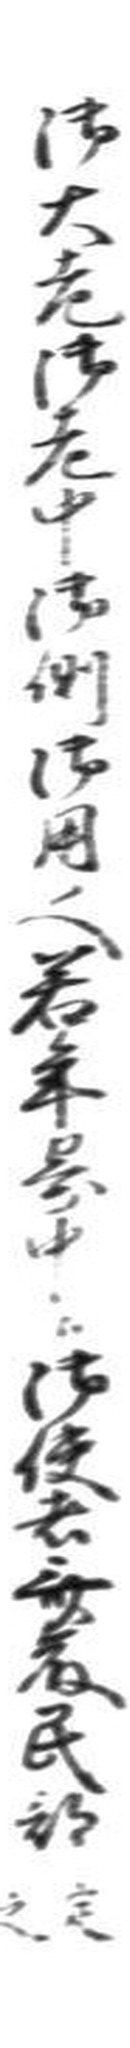御大老御老中御側御用人若年寄中江御使者斎藤民部定之
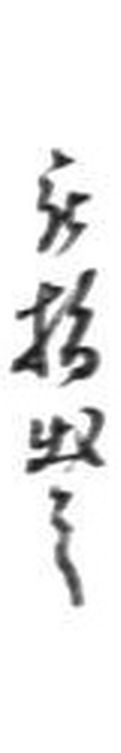被指出之

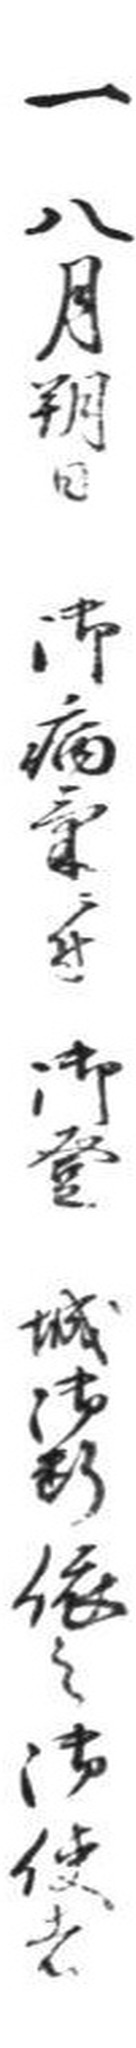一八月朔日御病気ニ付御登城御断依之御使者
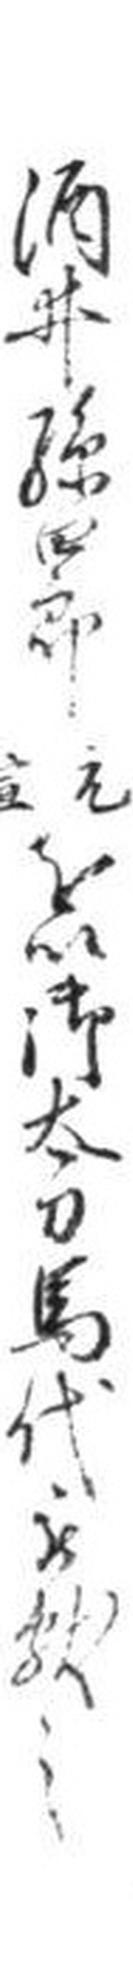酒井孫四郎元宣を以御太刀馬代被献之
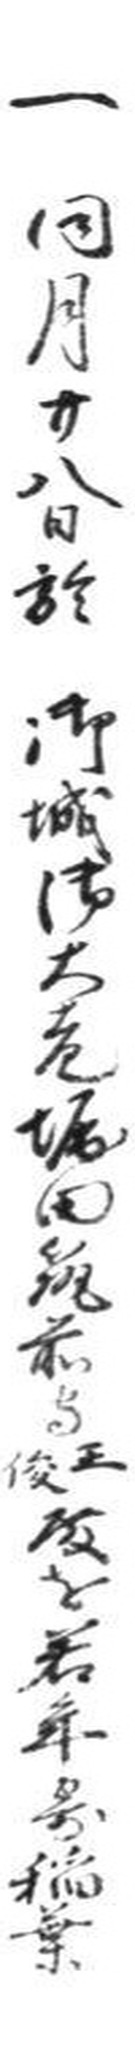一同月廿八日於御城御大老堀田筑前守正俊殿を若年寄稲葉
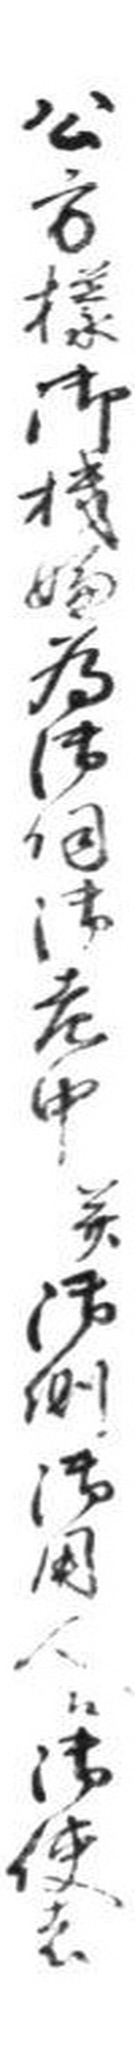公方様御機嫌為御伺御老中并御側御用人江御使者
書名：家譜 十五 綱昌公 従天和元年到元禄十二年
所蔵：福井県文書館 Fukui Prefectural Archives
